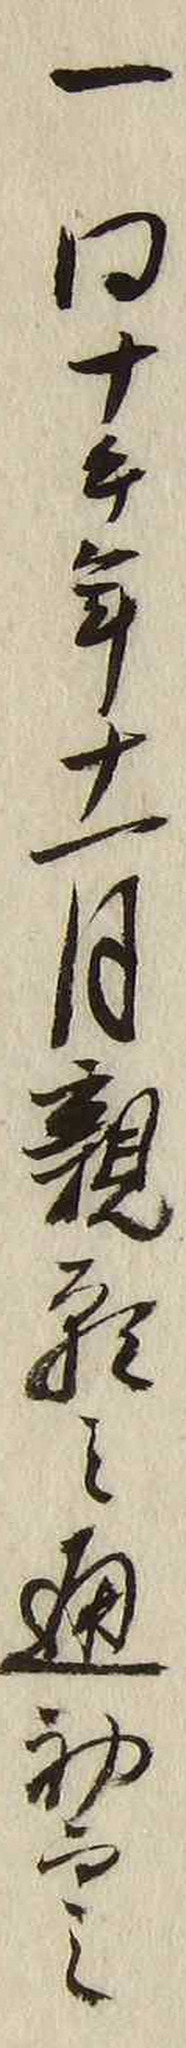一同十午年十一月親願之通初而之

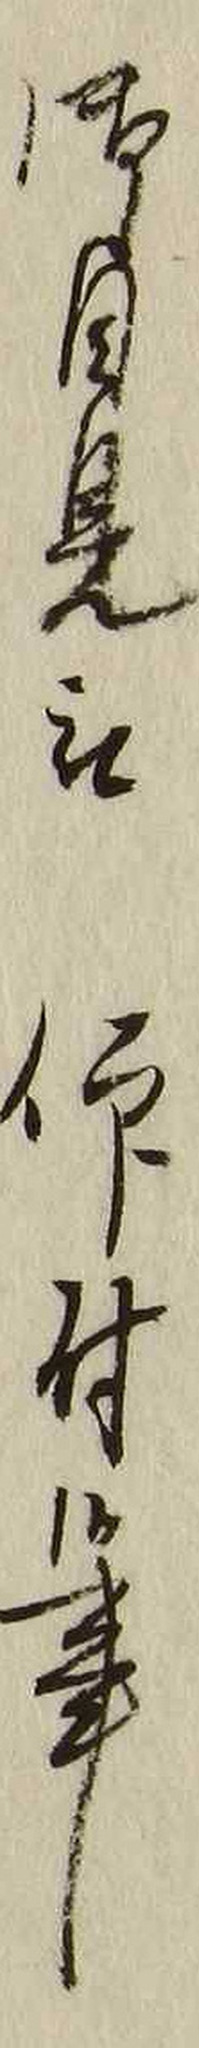御目見被仰付候事
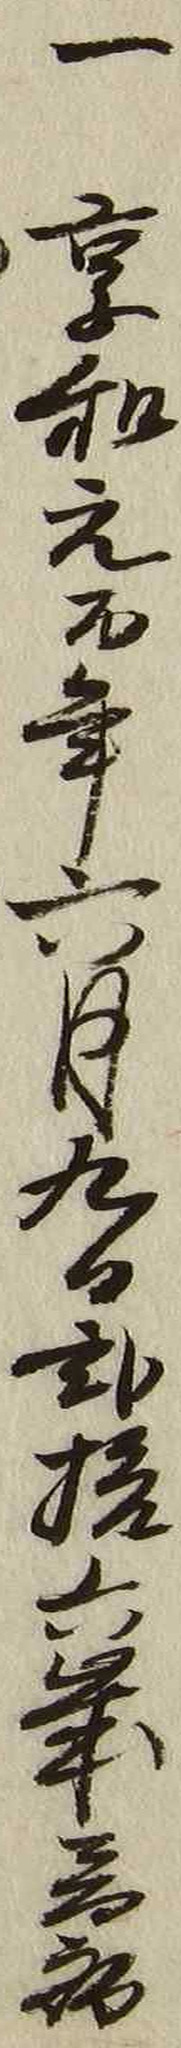一享和元酉年六月九日弐拾六歳ニ而病
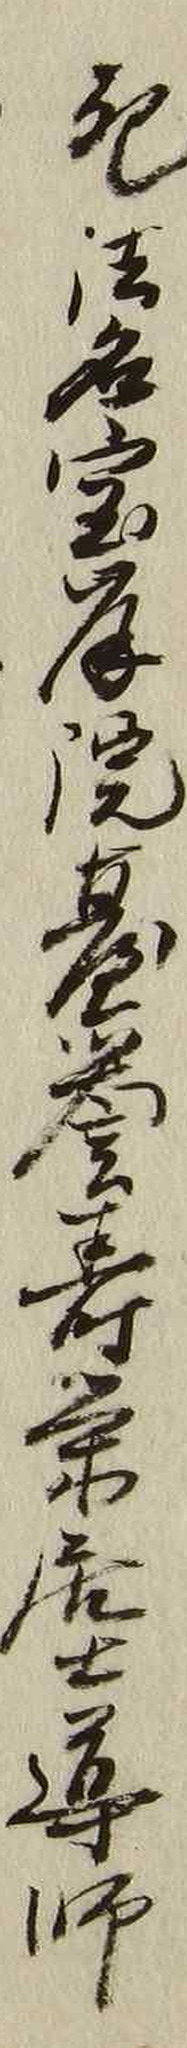死法名宝岸院台誉寿栄居士導師
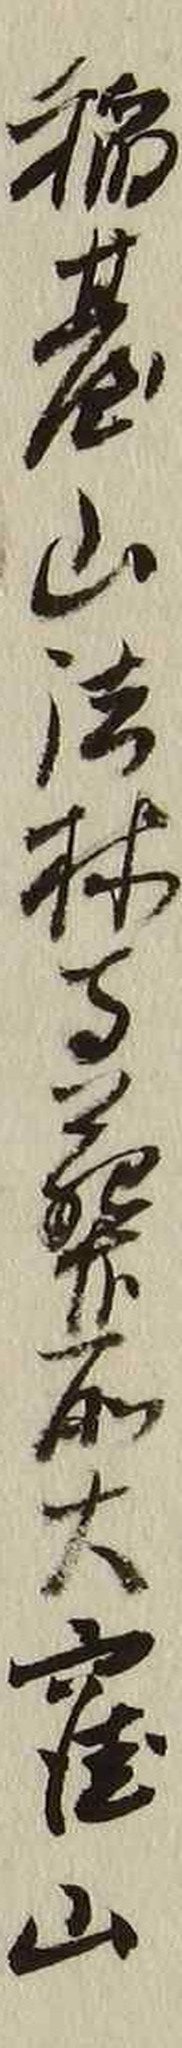稲台山法林寺葬所大窪山
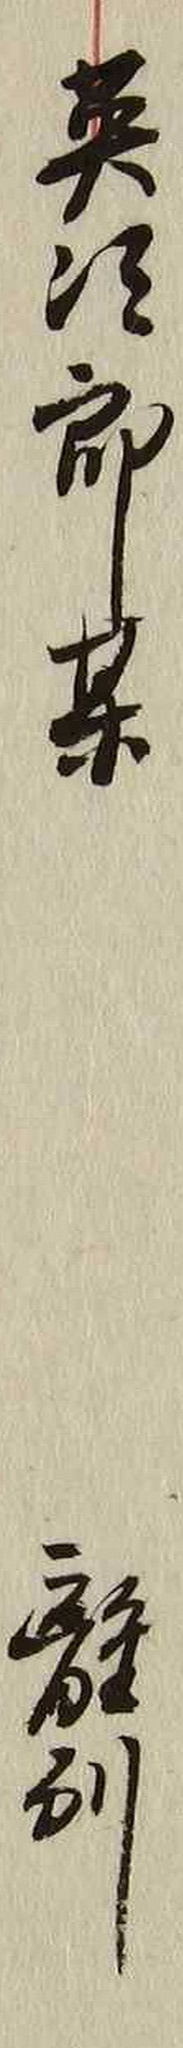英次郎某離別
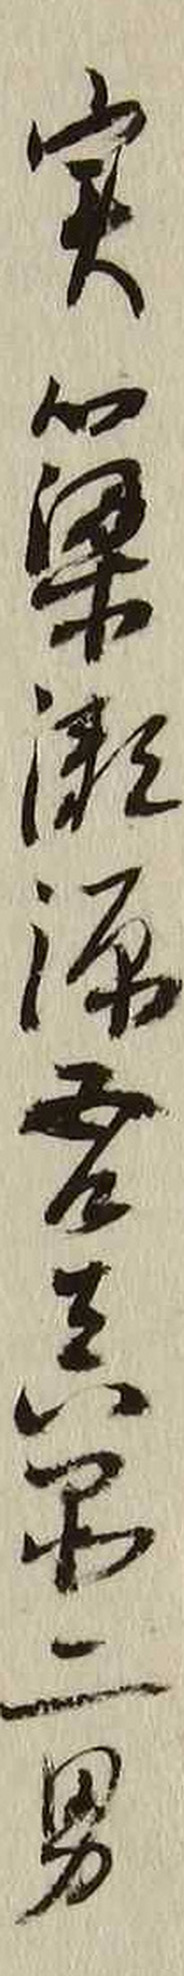実簗瀬源吾真品二男
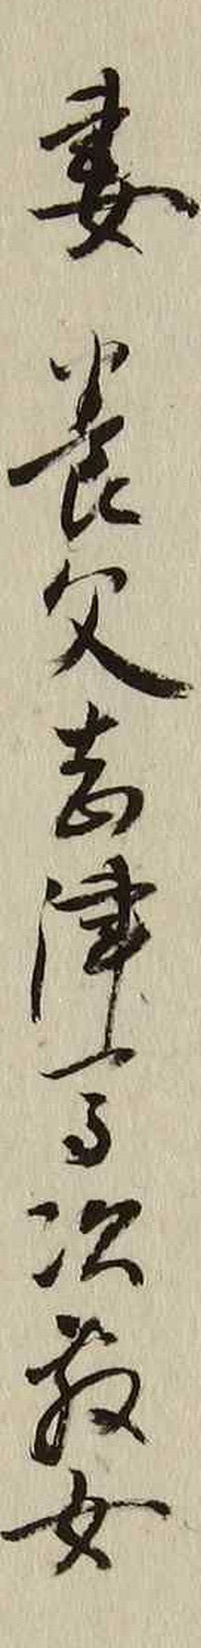妻養父志津馬次敷女
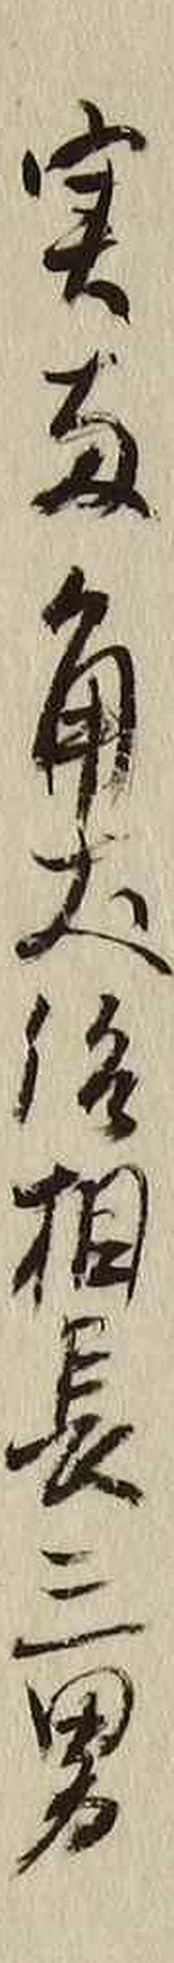実両角丈治相長三男
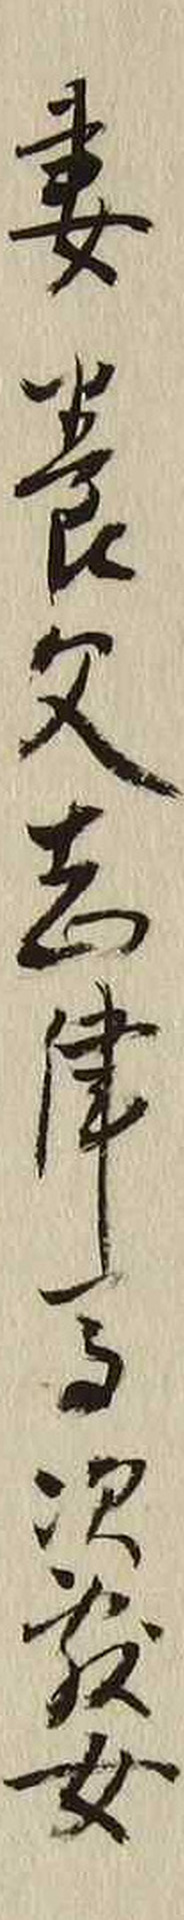妻養父志津馬次敷女
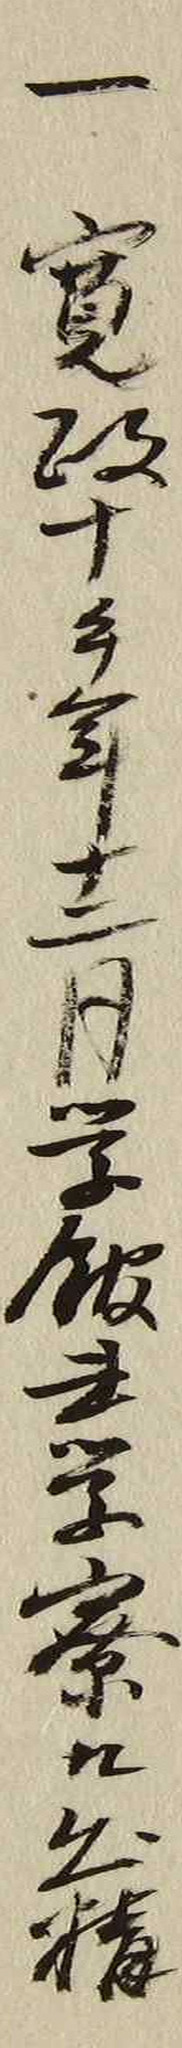一寛政十午年十二月学館書学寮江出精
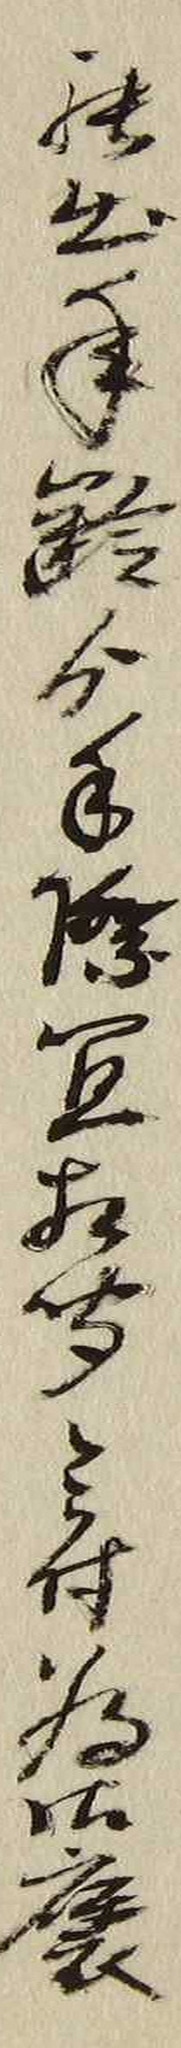罷出年齢ゟ手際宜相聞候ニ付為御褒
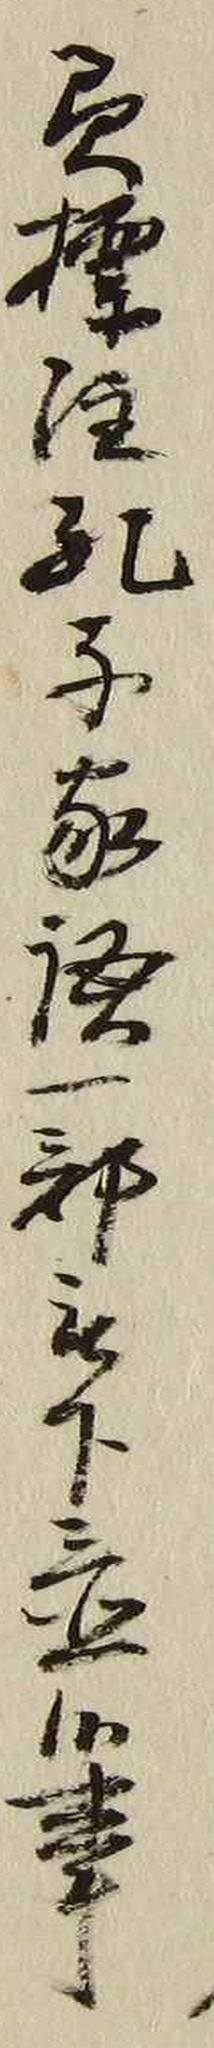美標注孔子家語一部被下置候事
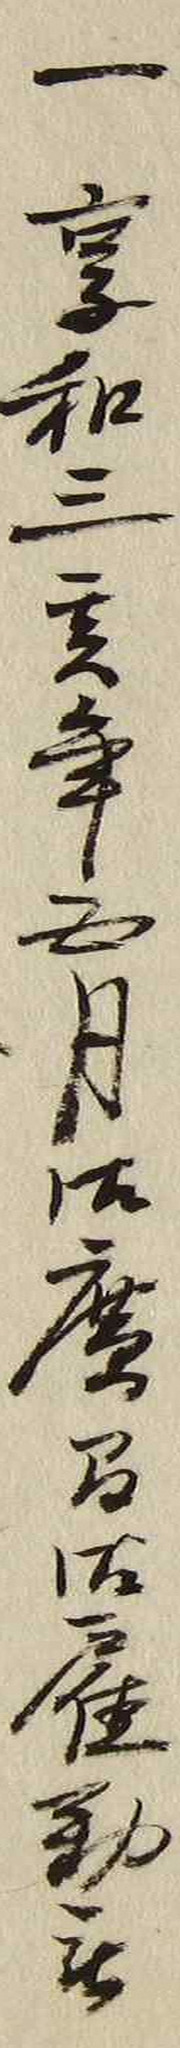一享和三亥年五月御広間御雇勤被
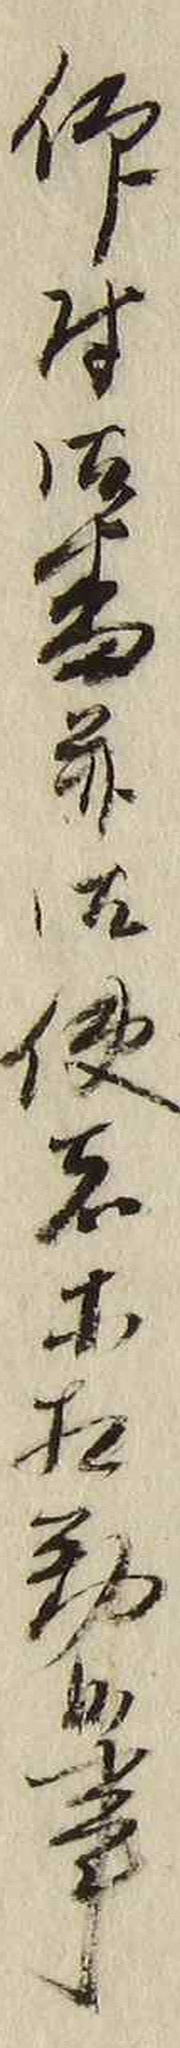仰付御番并御前使者等相勤候事

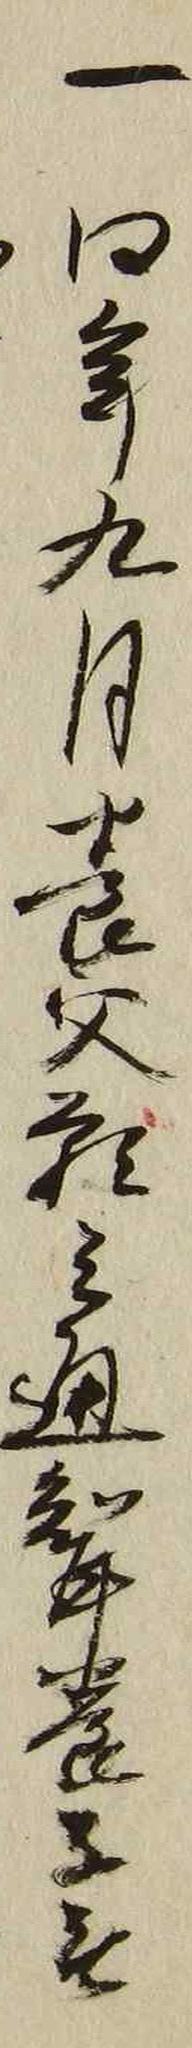一同年九月養父願之通婿養子被
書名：諸士系譜　巻之345　も之部1
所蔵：会津若松市立会津図書館
